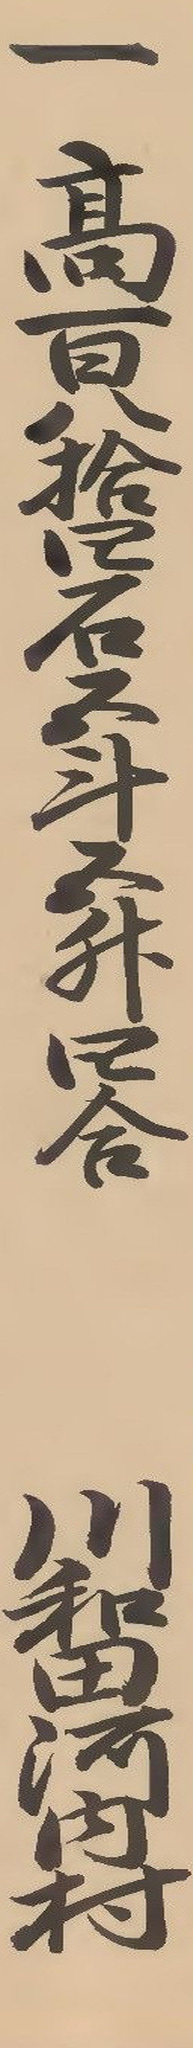一高三百四拾九石壱斗七升河和田河内村
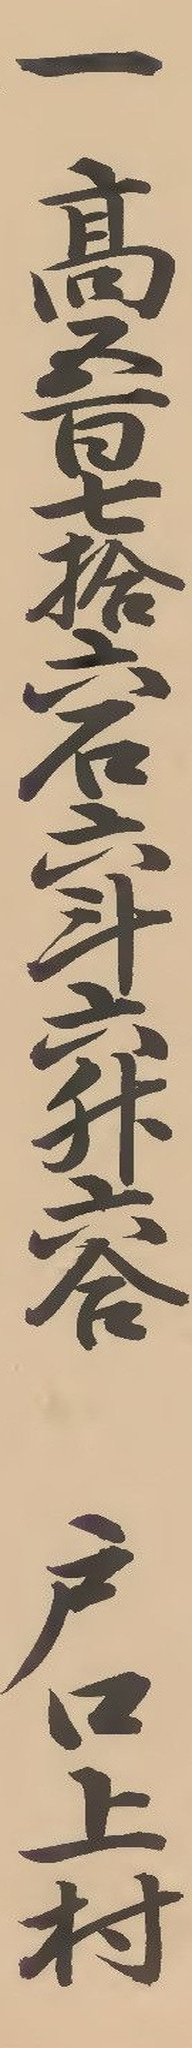一高五百七拾六石六斗六升六合戸口上村

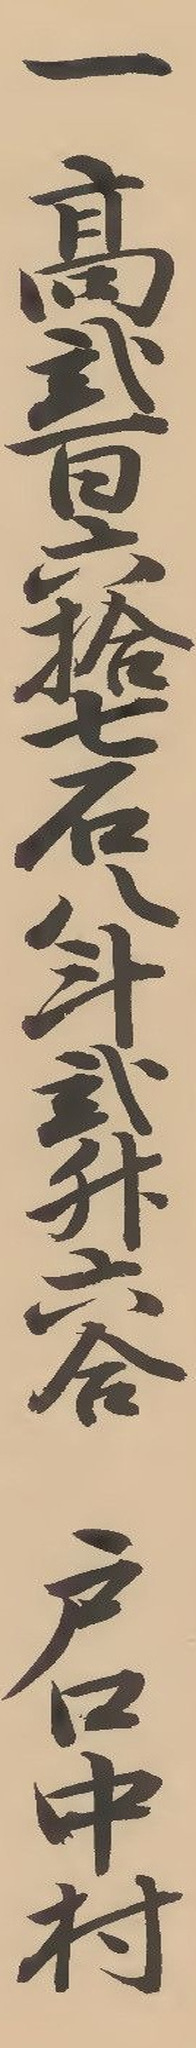一高弐百六拾七石八斗弐升六合戸口中村
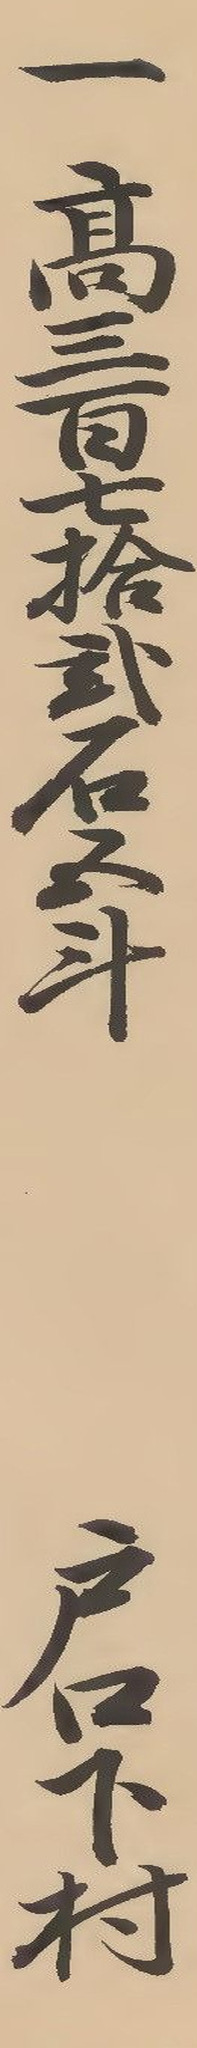一高三百七拾弐石五斗戸口下村
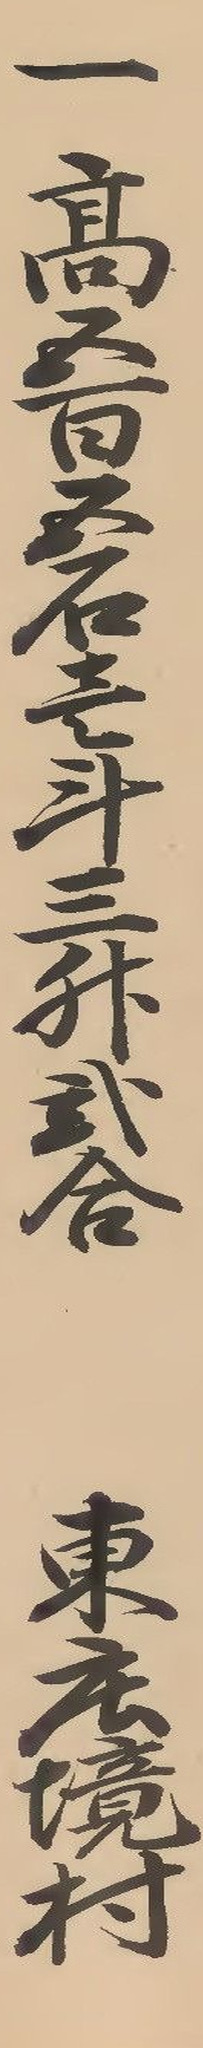一高五百五石壱斗三升弐合東庄境村

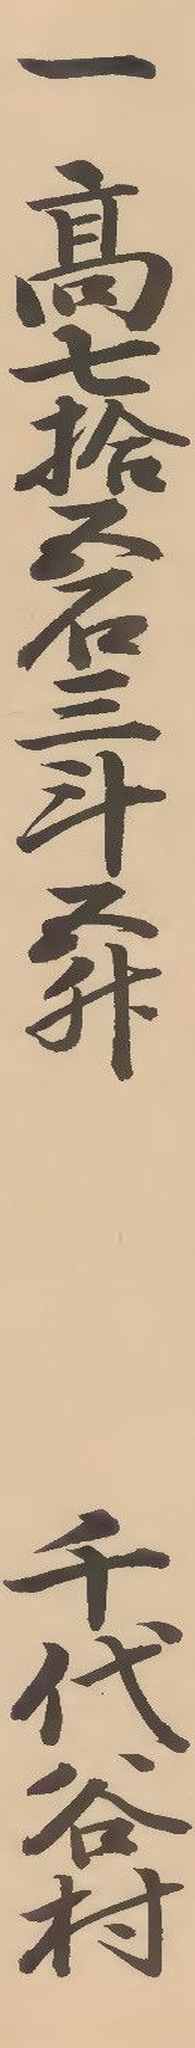一高七拾五石三斗五升千代谷村
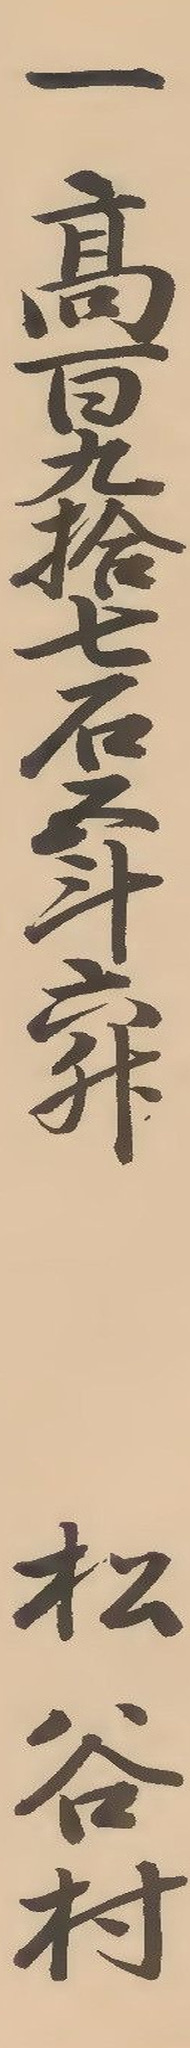一高百九拾七石五斗六升松谷村
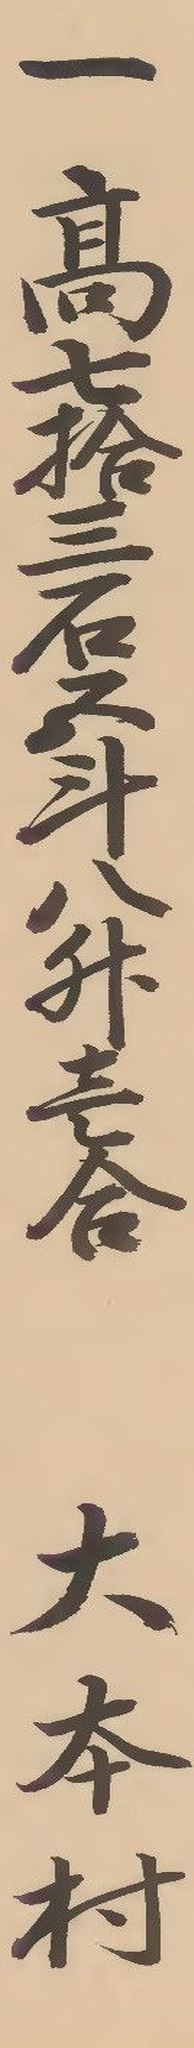一高七拾三石五斗八升壱合大本村

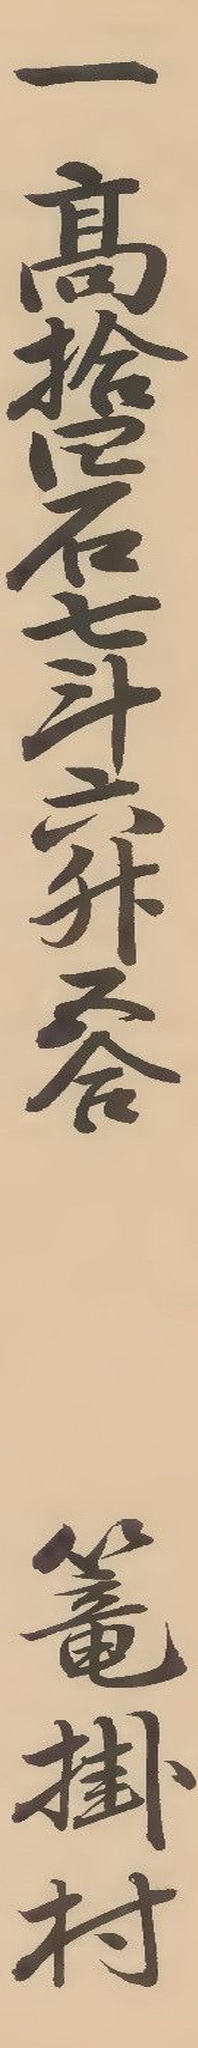一高拾四石七斗六升五合篭掛村
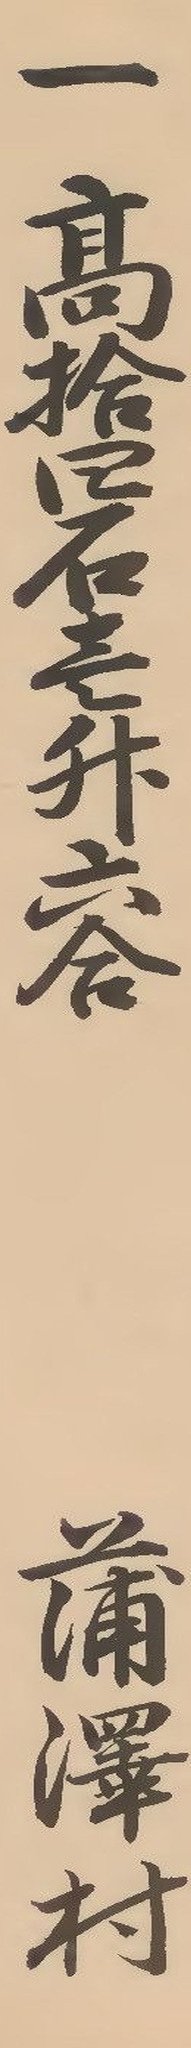一高拾四石壱升六合蒲沢村
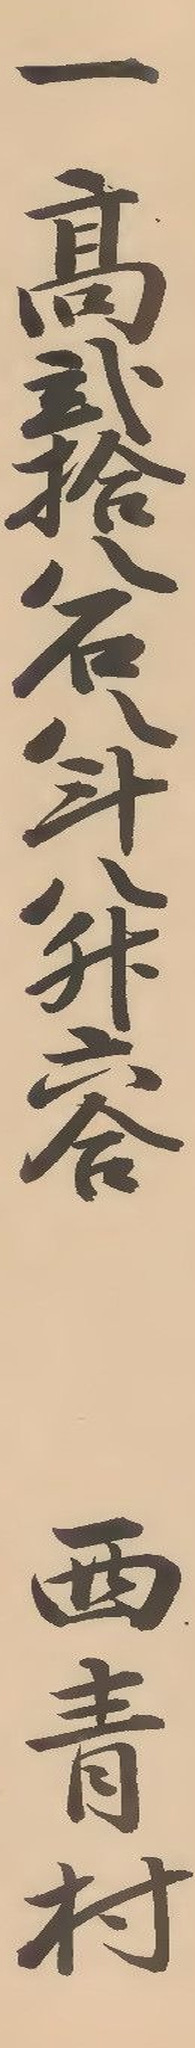一高弐拾八石八斗八升六合西青村
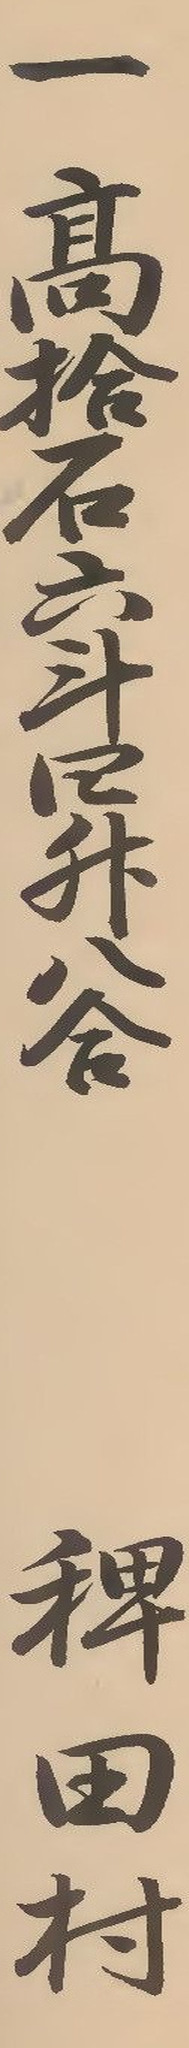一高拾石六斗四升八合稗田村
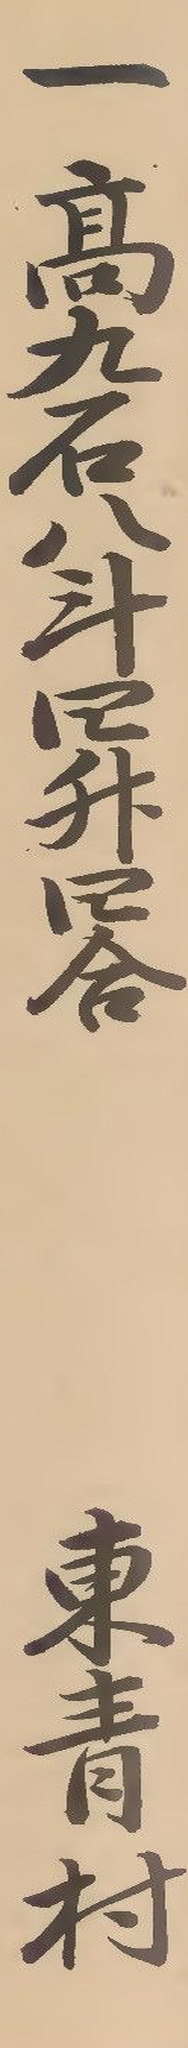一高九石八斗四升四合東青村
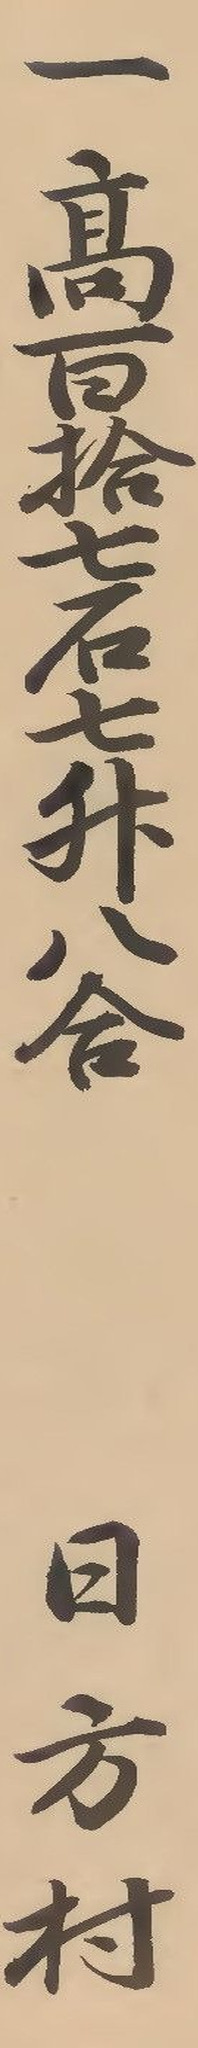一高百拾七石七升八合日方村
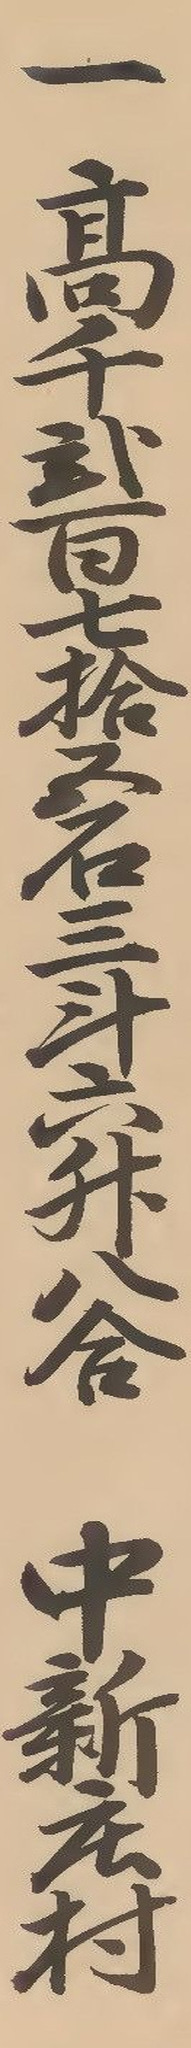一高千弐百七拾五石三斗六升八合中新庄村
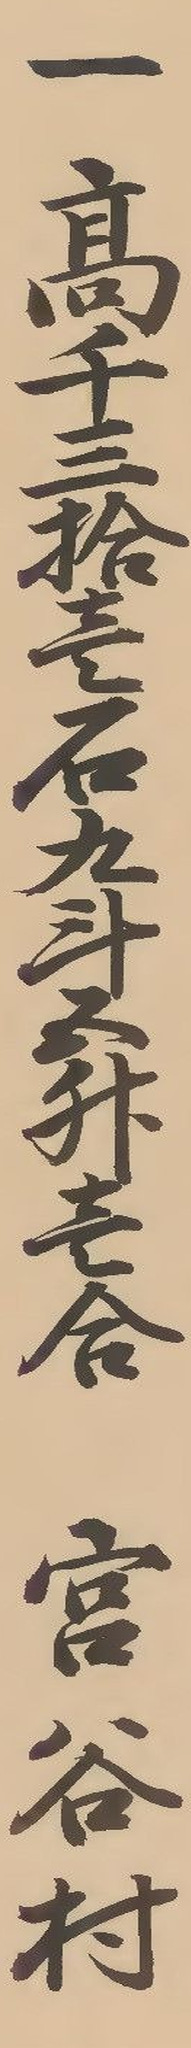一高千三拾壱石九斗五升壱合宮谷村
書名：越前国郷帳
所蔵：国立公文書館 National Archives of Japan
